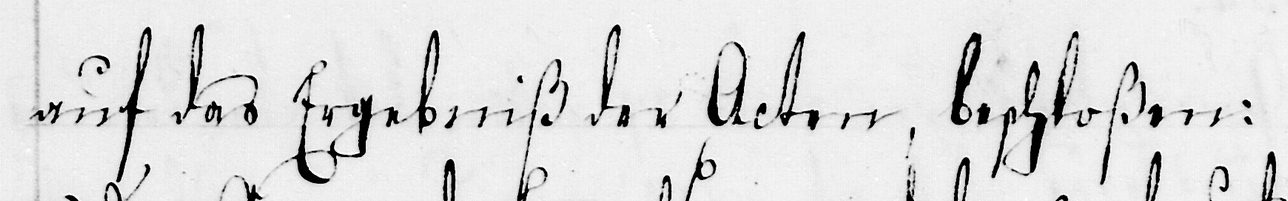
auf das Ergebniß der Acten, beschloßen:
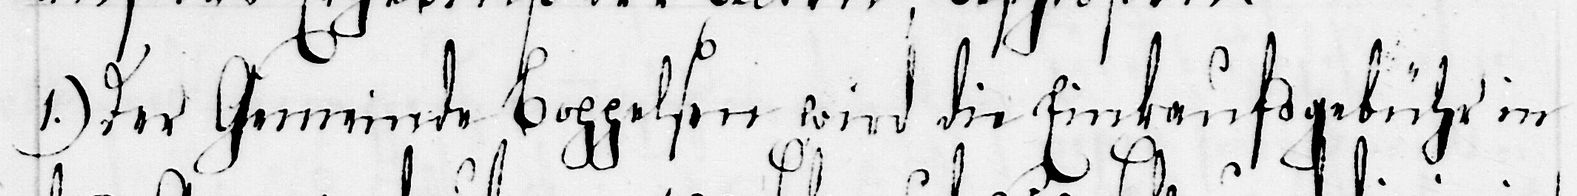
1.) Der Gemeinde Boppelsen wird die Einkaufsgebühr in
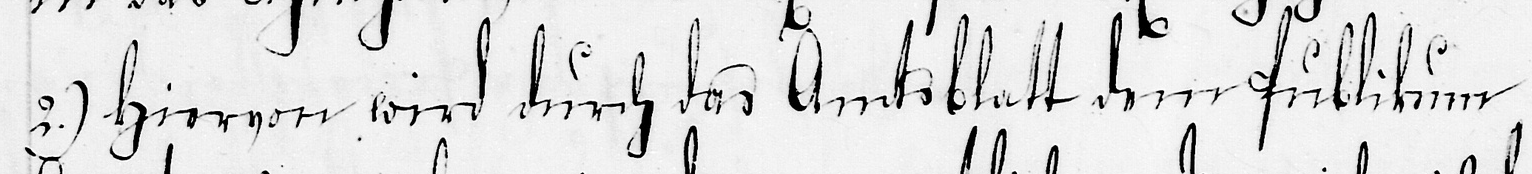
2.) Hiervon wird durch das Amtsblatt dem Publikum
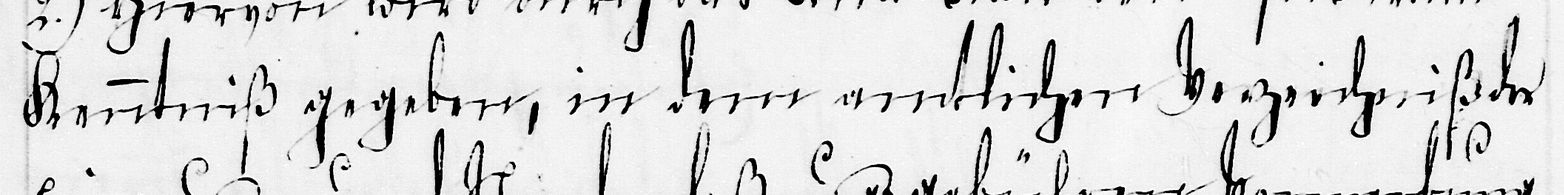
Kenntniß gegeben, in dem amtlichen Verzeichniß der
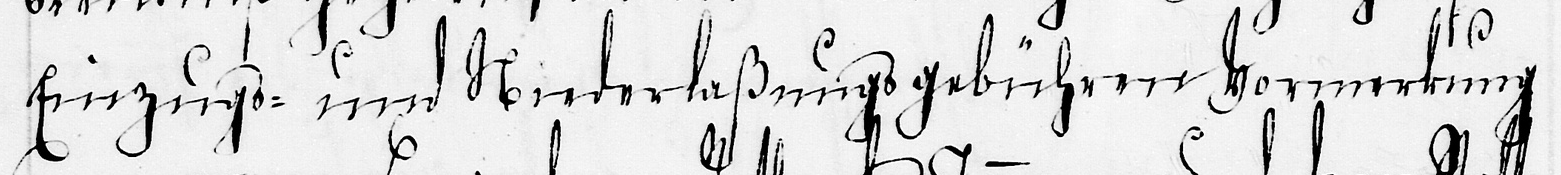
Einzugs- und Niederlaßungsgebühren Vormerkung
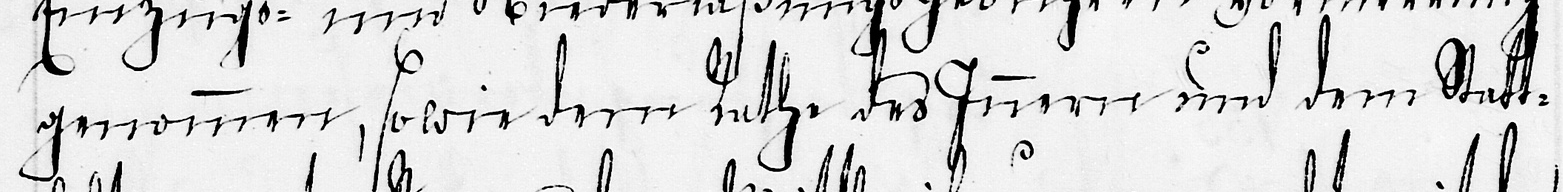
genommen, sowie dem Rathe des Innern und dem Statt¬
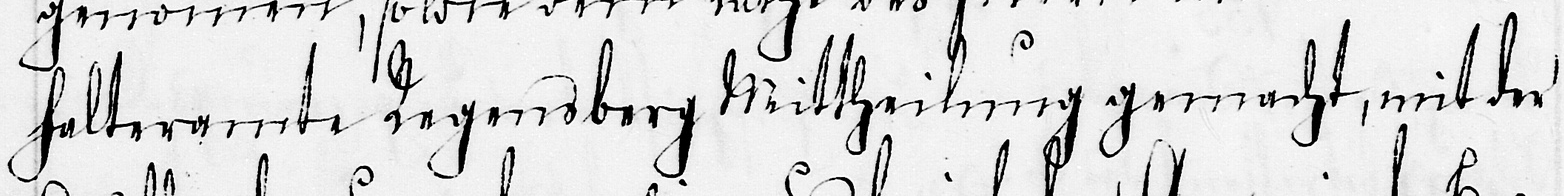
halteramte Regensberg Mittheilung gemacht, mit der
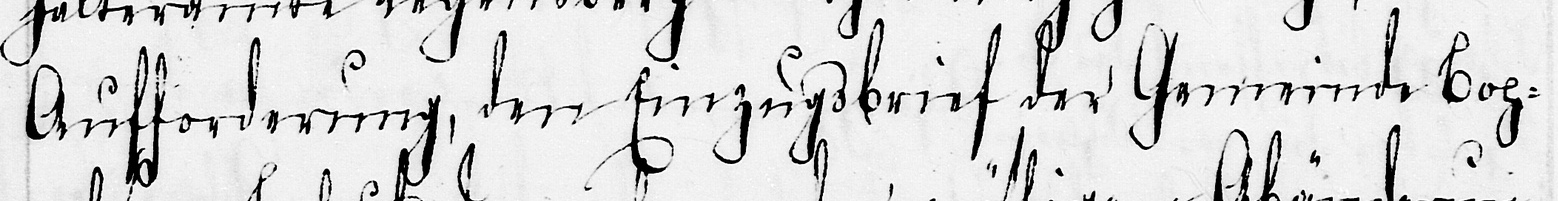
Aufforderung, den Einzugsbrief der Gemeinde Bop¬
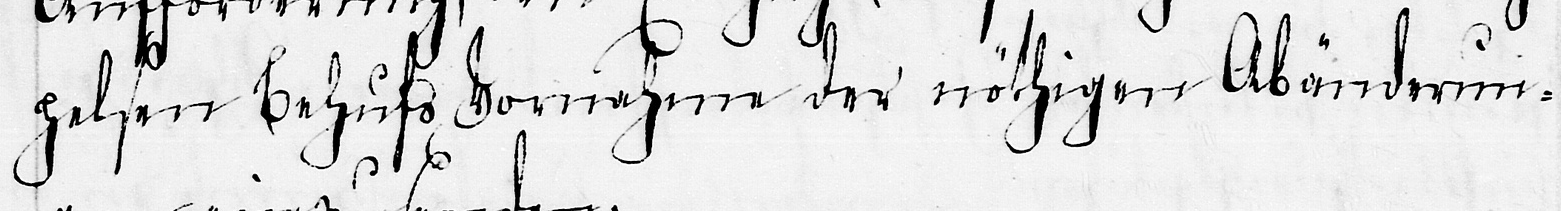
pelsen Behufs Vornahme der nöthigen Abänderun¬
